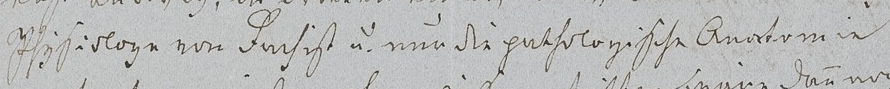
Physiologe von Fach ist u. nur die pathologische Anatomie
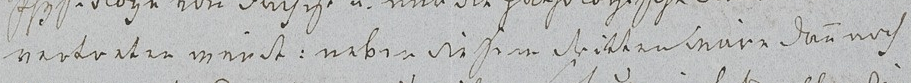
vertreten würde: neben diesem dritten wäre dann noch
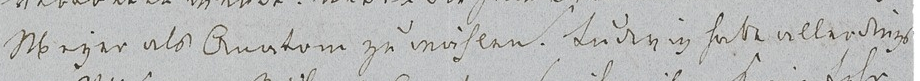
Meyer als Anatom zu wählen. Ludwig habe allerdings
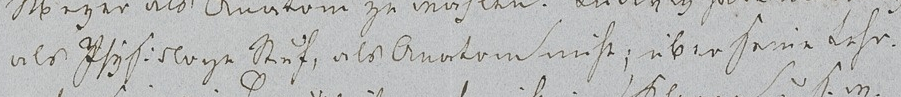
als Physiologe Ruf, als Anatom nicht; über seine Lehr-
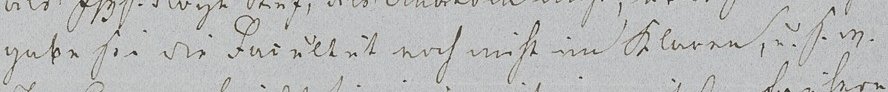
gabe sei die Fäcultät noch nicht im Klaren, u. s. w.
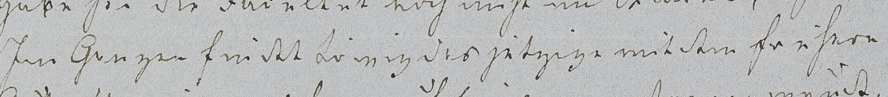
Im Ganzen findet Löwig das jetzige mit dem frühern
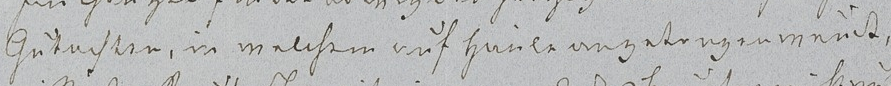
Gutachten, in welchem auf Härle angetragen wurde,
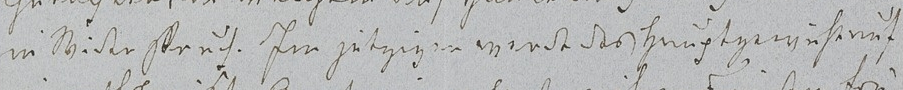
in Widerspruch. Im jetzigen werde das Hauptgewicht auf
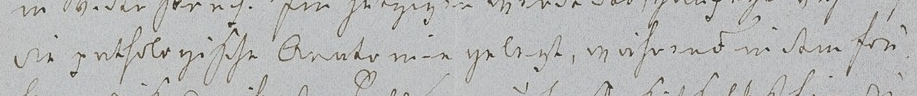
die pathologische Anatomie gelegt, während in dem frü-
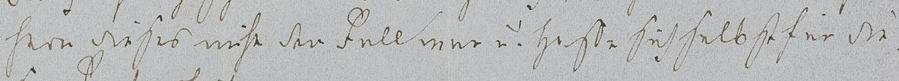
hern dieses nicht der Fall war u. Hasse sich selbst für die-
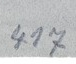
Fach
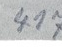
erbot.
